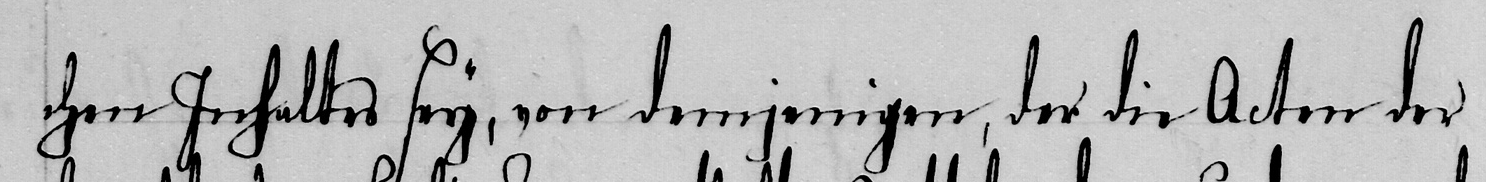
chen Inhaltes sey, von demjenigen, der die Acten der
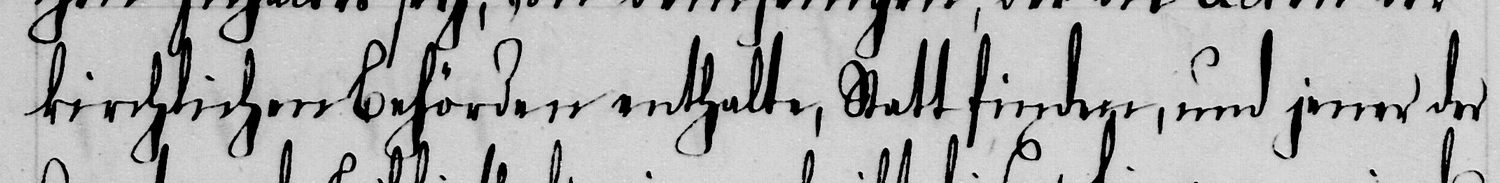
kirchlichen Behörden enthalte, Statt finden, und jener der
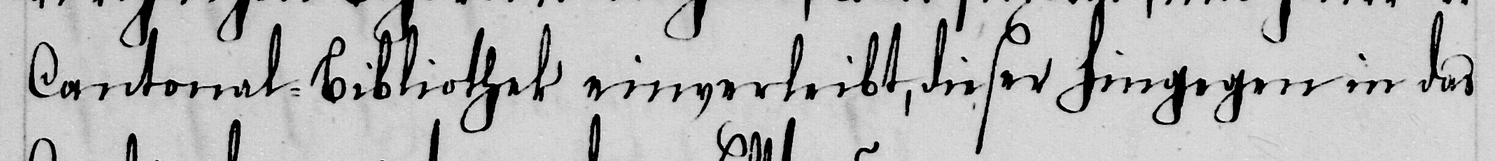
Cantonal-Bibliothek einverleibt, dieser hingegen in das
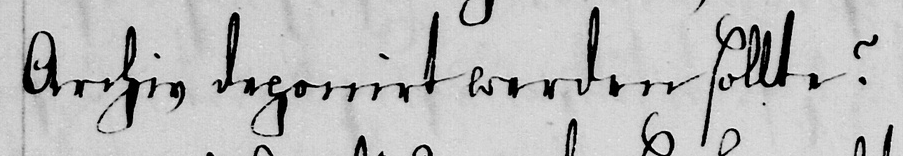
Archiv deponirt werden sollte?
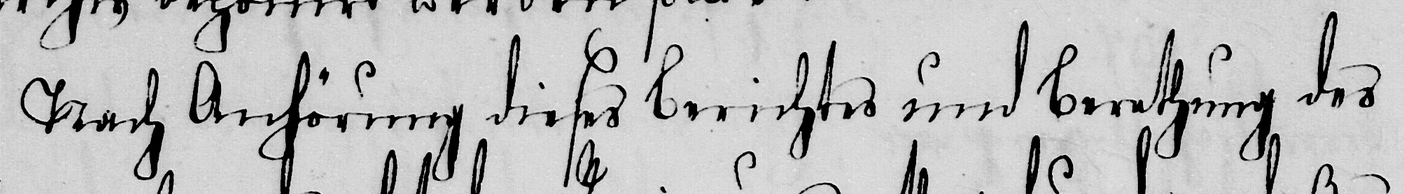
Nach Anhörung dieses Berichtes und Berathung des
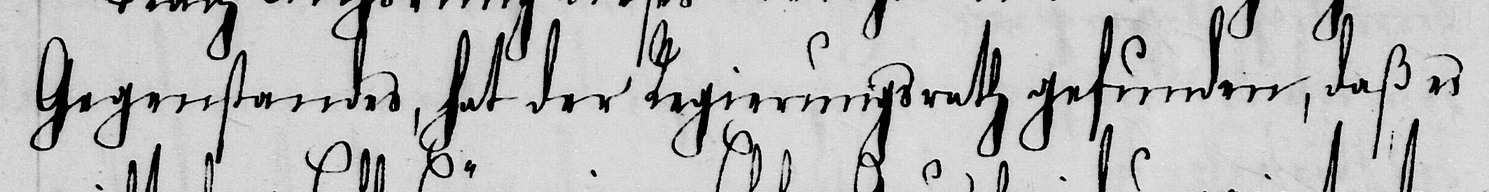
Gegenstandes, hat der Regierungsrath gefunden, daß es
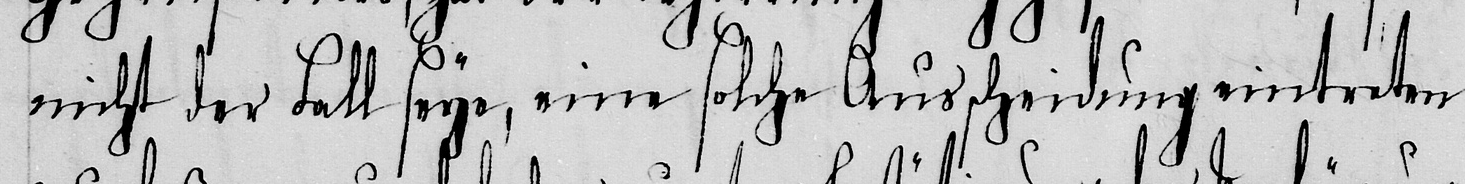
nicht der Fall seye, eine solche Ausscheidung eintreten
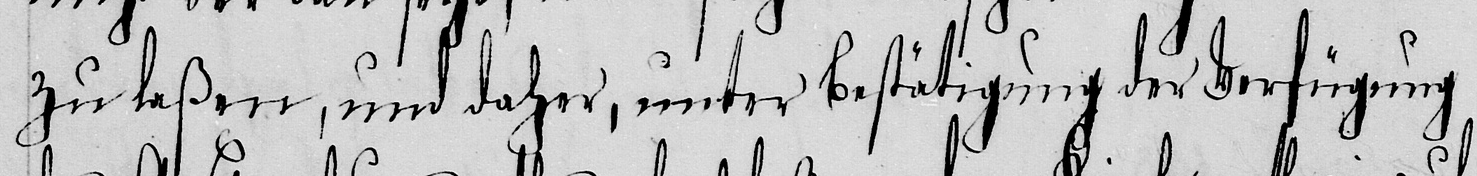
zu laßen, und daher, unter Bestätigung der Verfügung
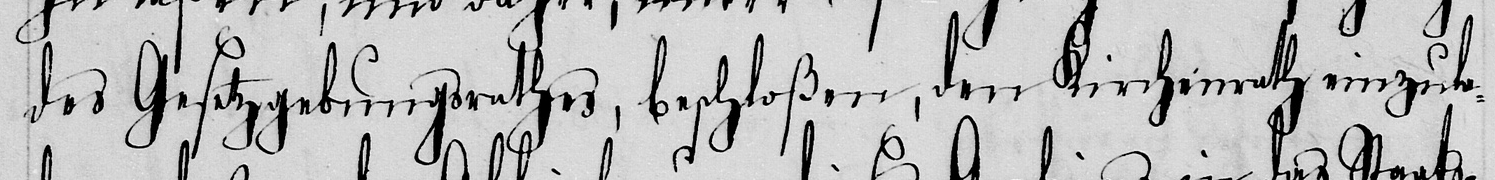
des Gesetzgebungsrathes, beschloßen, den Kirchenrath einzula¬
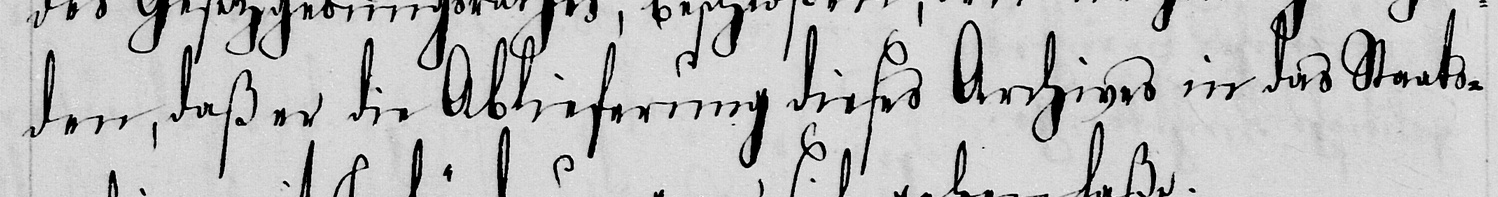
den, daß er die Ablieferung dieses Archives in das Staat¬
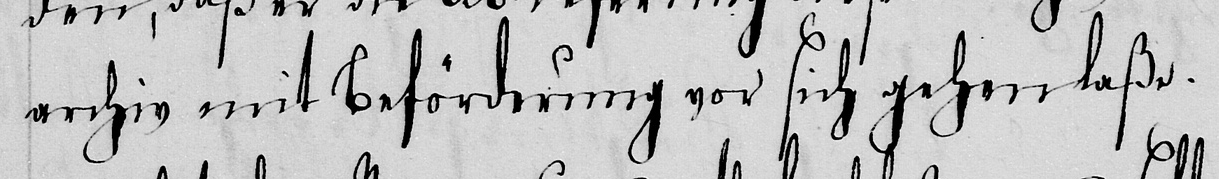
sarchiv mit Beförderung vor sich gehen laße.
